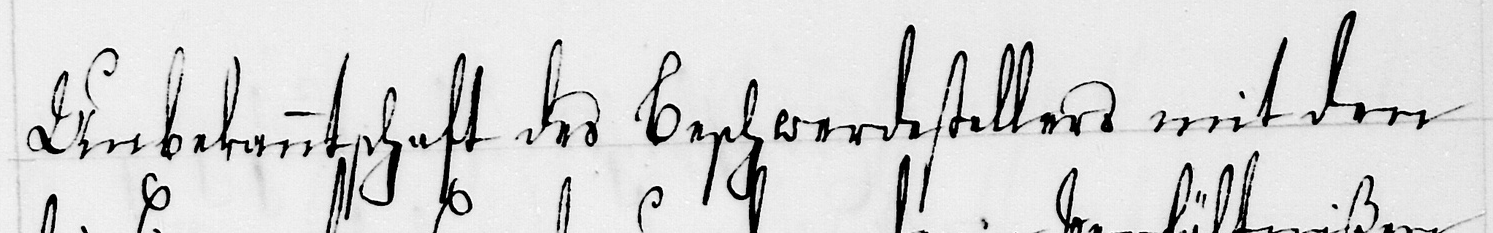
Unbekanntschaft des Beschwerdestellers mit den
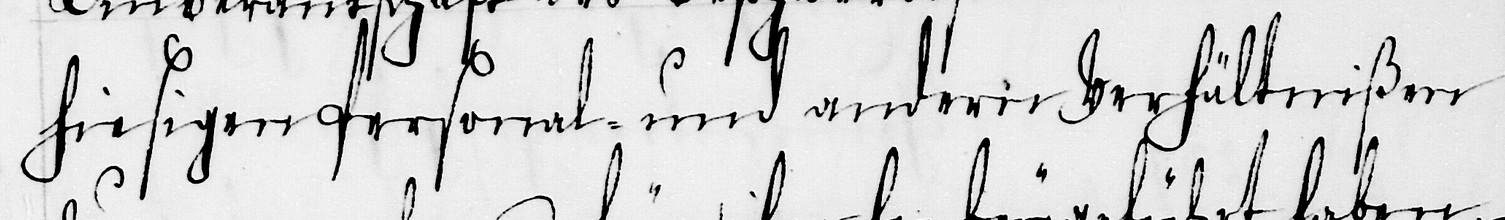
hiesigen Personal- und andern Verhältnißen
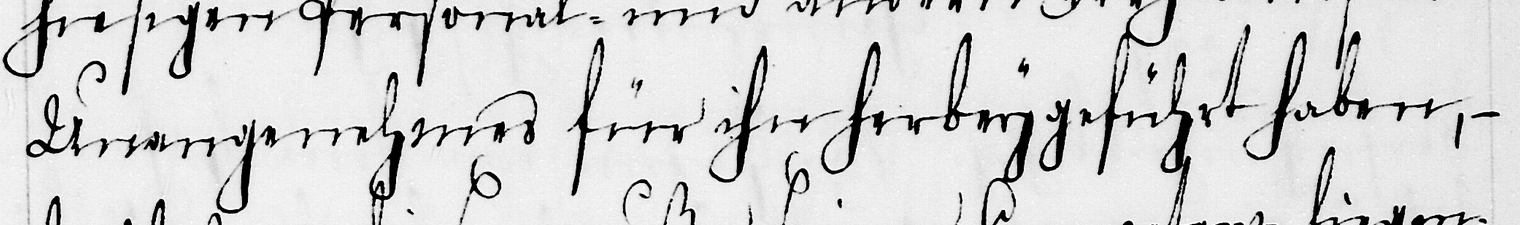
Unangenehmes für ihn herbeygeführt haben,
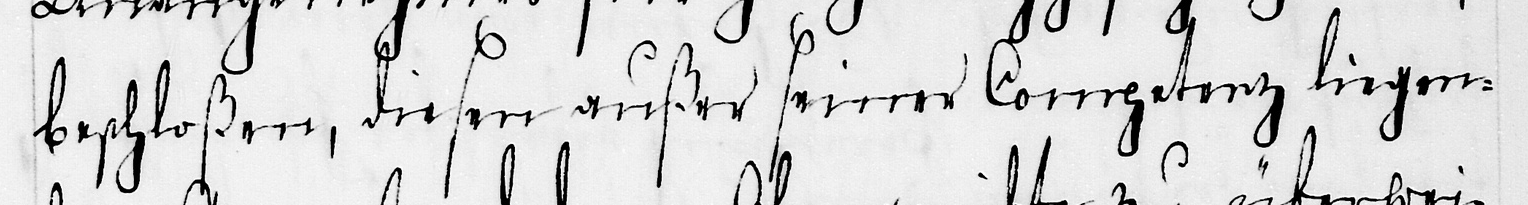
beschloßen, diesen außer seiner Competenz liegen¬
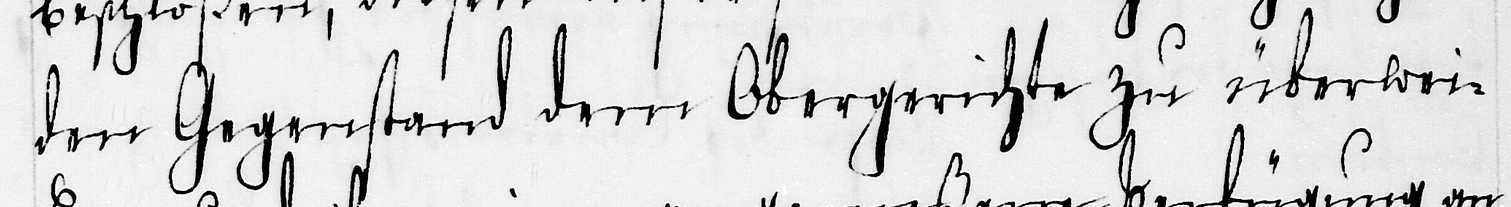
den Gegenstand dem Obergerichte zu überwei¬
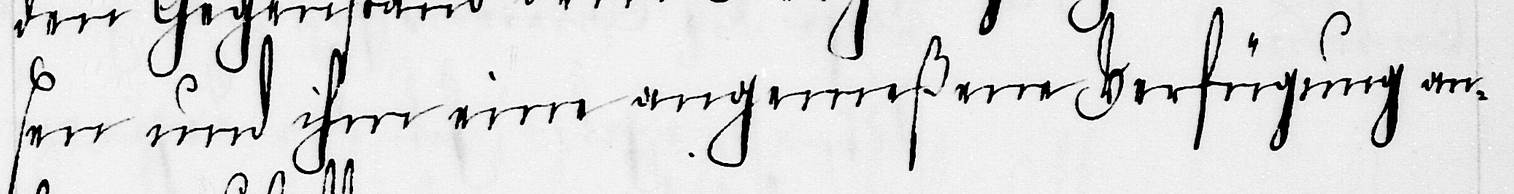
sen und ihm eine angemeßene Verfügung an¬
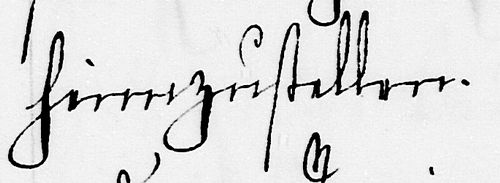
heimzustellen.
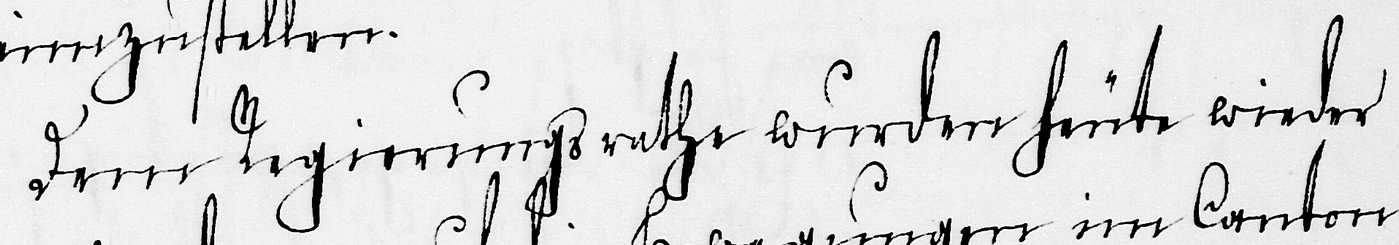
Dem Regierungsrathe wurden heute wieder
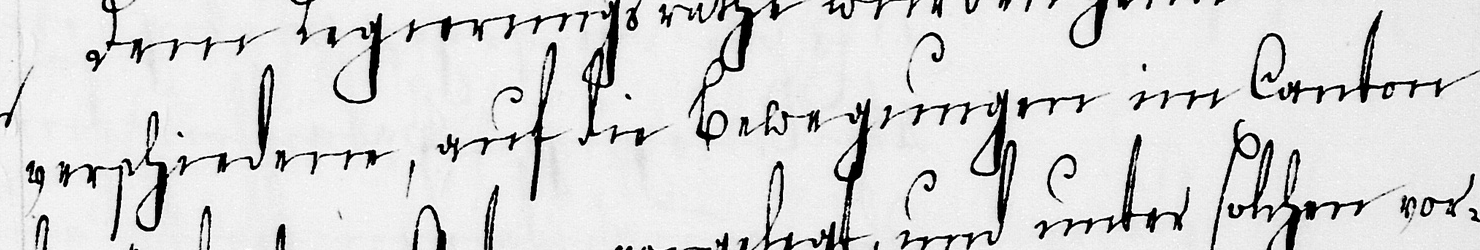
verschiedene, auf die Bewegungen im Canton
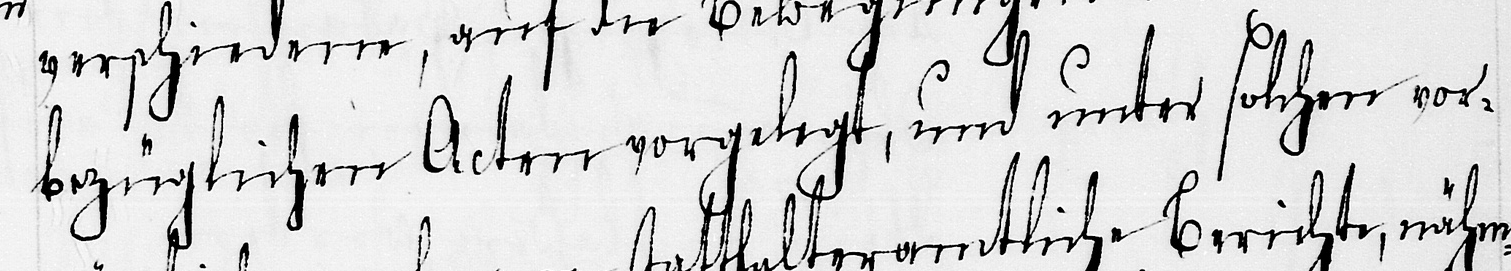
bezüglichen Acten vorgelegt, und unter solchen vor¬
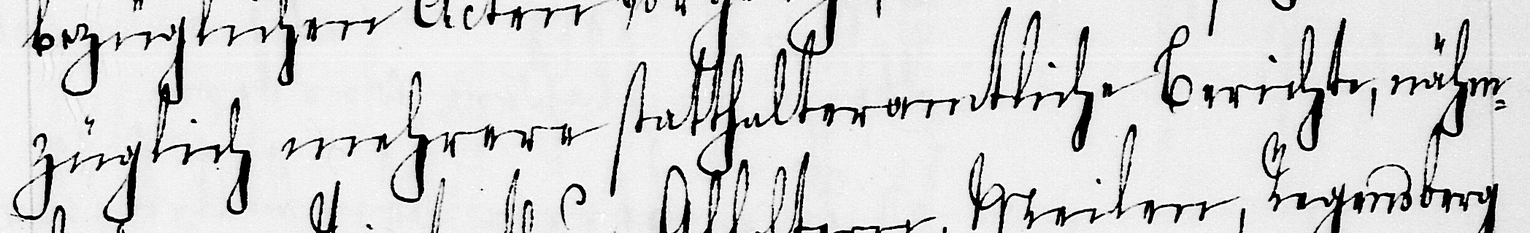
züglich mehrere statthalteramtliche Berichte, nähm¬
